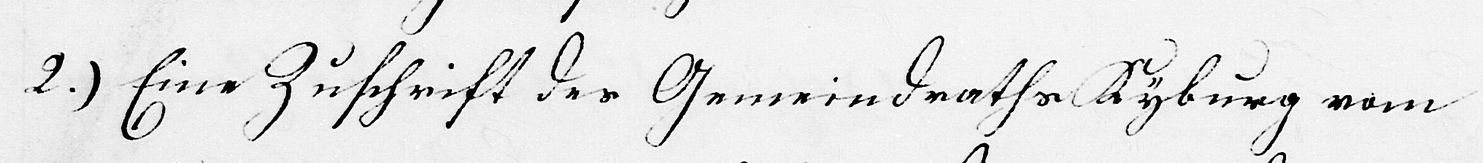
2.) Eine Zuschrift des Gemeindraths Kyburg vom
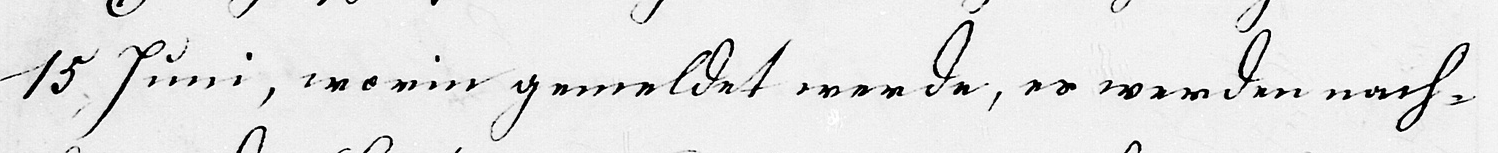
15 Juni, worin gemeldet werde, es werden nach¬
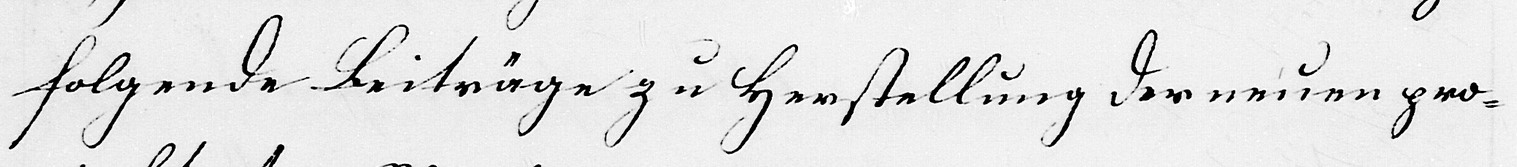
folgende Beiträge zu Herstellung der neuen pro¬
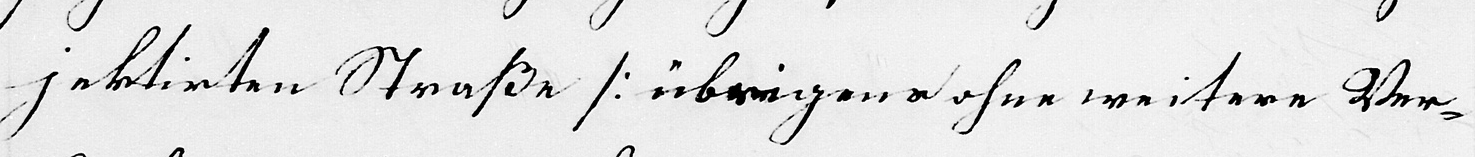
jektirten Straße [übrigens ohne weitere Ver¬
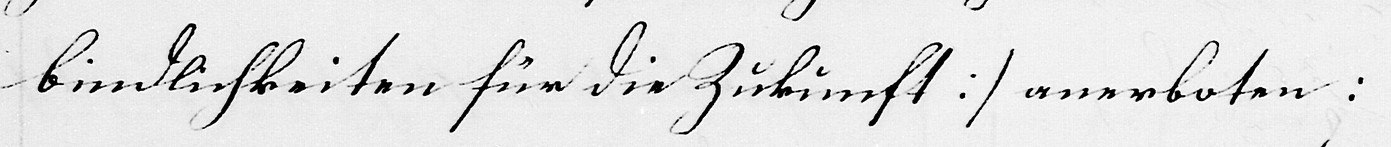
bindlichkeiten für die Zukunft] anerboten:
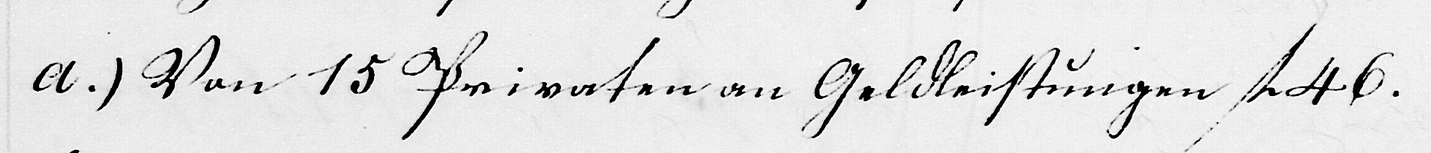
a.) Von 15 Privaten an Geldleistungen fl 46.
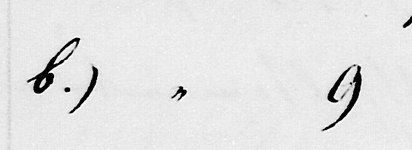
b.) „ 9
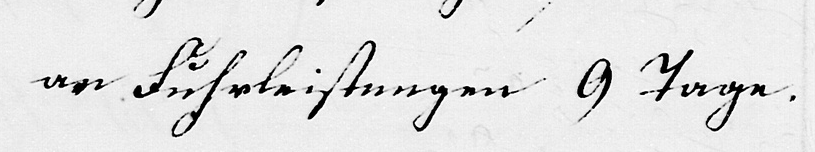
an Fuhrleistungen 9 Tage.
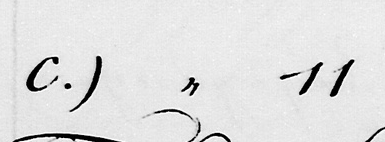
c.) „ 11
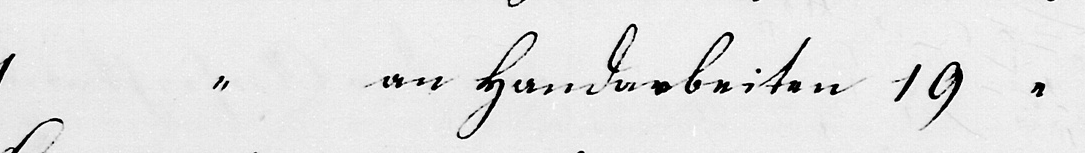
„ an Handarbeiten 19 „
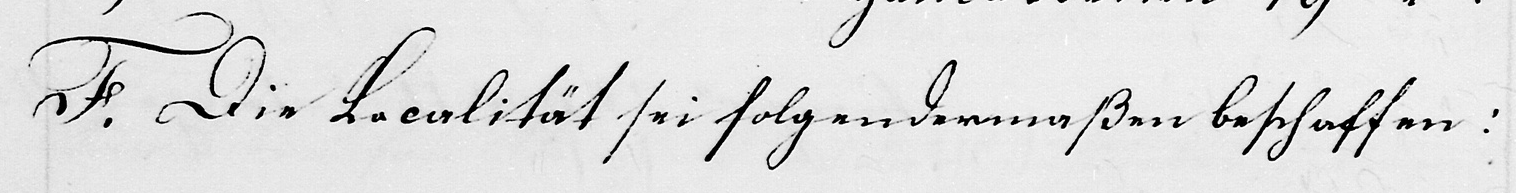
F. Die Localität sei folgendermaßen beschaffen:
